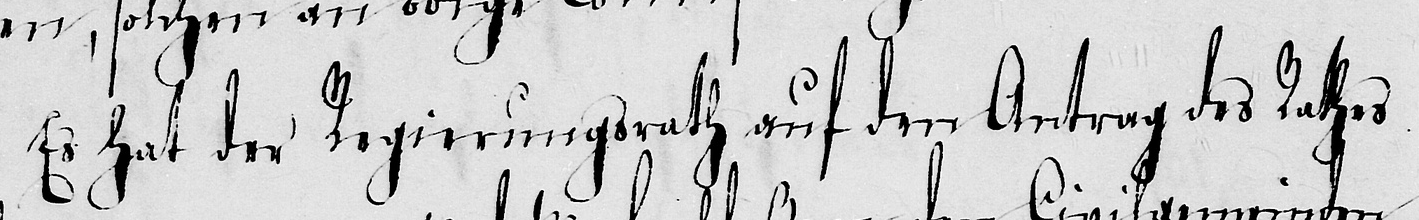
Es hat der Regierungsrath auf den Antrag des Rathes
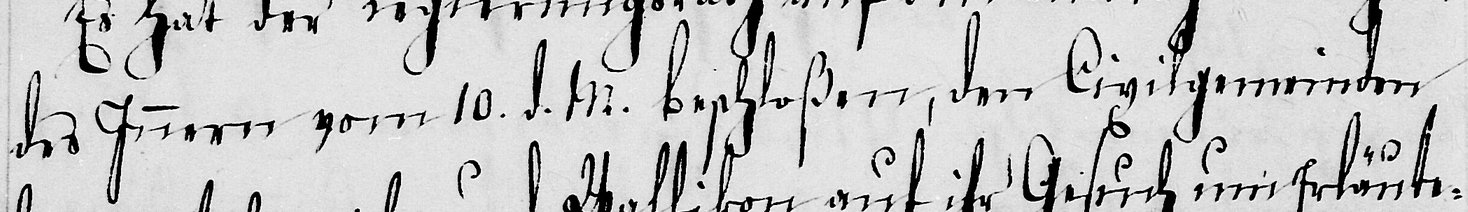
des Innern vom 10. d. M. beschloßen, den Civilgemeinden
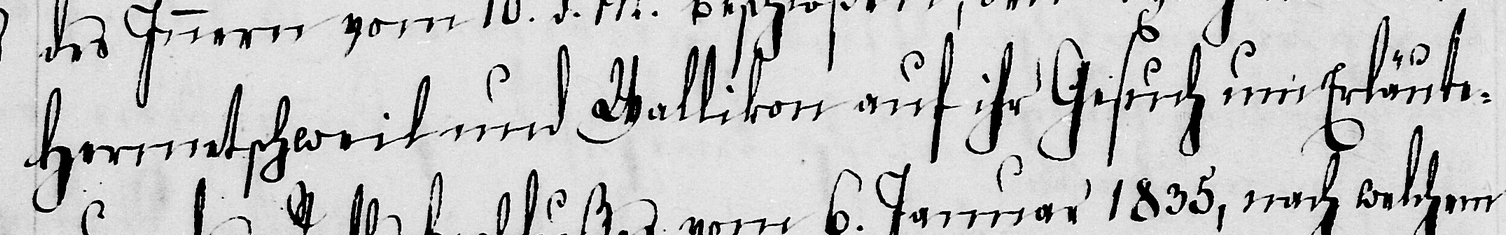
Hermatschweil und Wallikon auf ihr Gesuch um Erläute¬
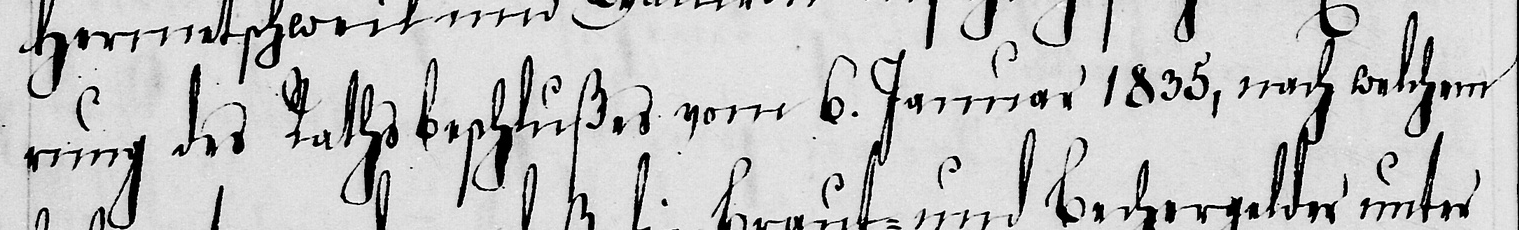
rung des Rathsbeschlußes vom 6. Januar 1835, nach welchem
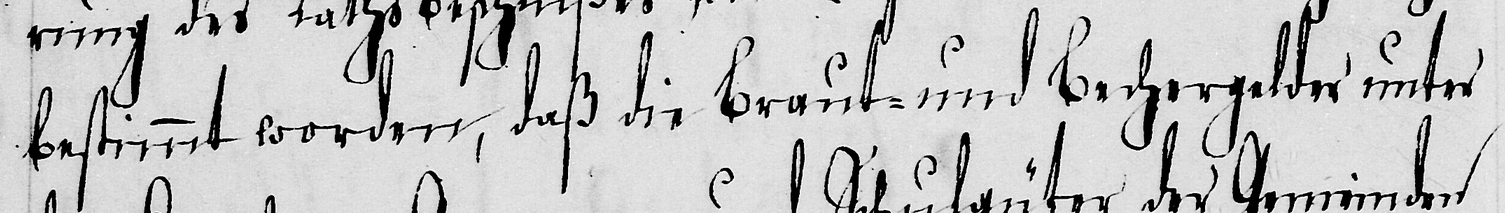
bestimmt worden, daß die Braut- und Bechergelder unter
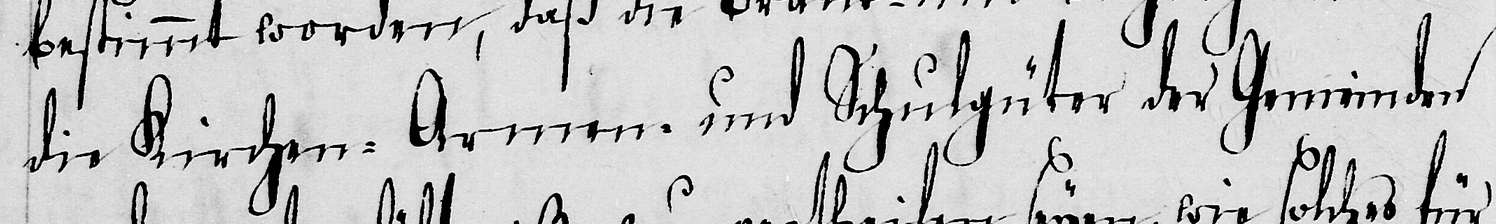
die Kirchen- Armen- und Schulgüter der Gemeinden
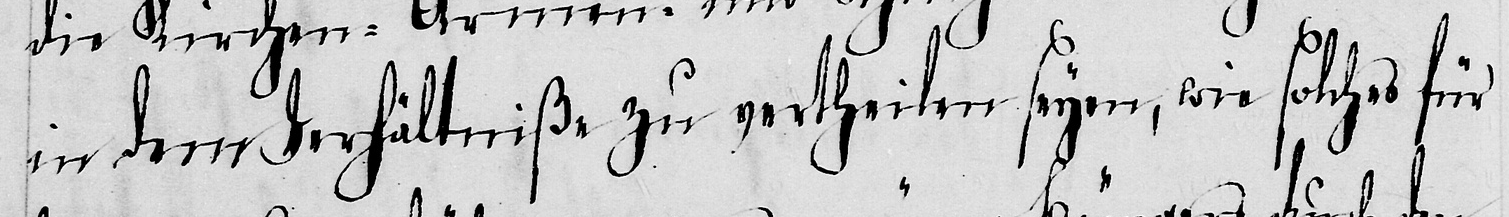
in dem Verhältniße zu vertheilen seyen, wie solches für
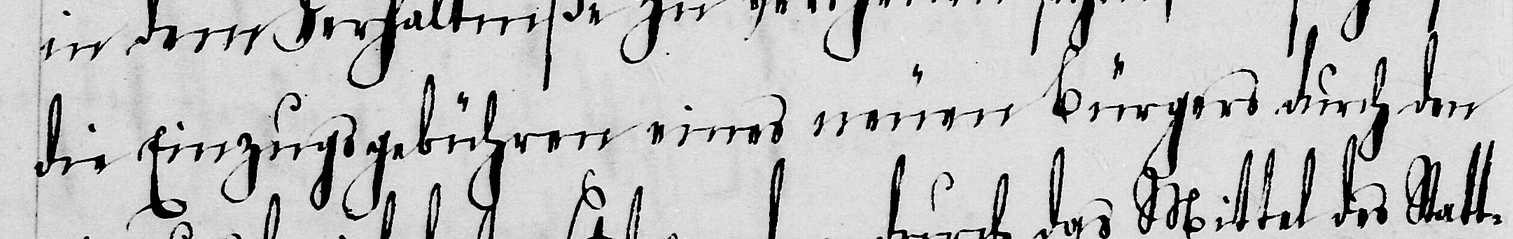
die Einzugsgebühren eines neuen Bürgers durch den
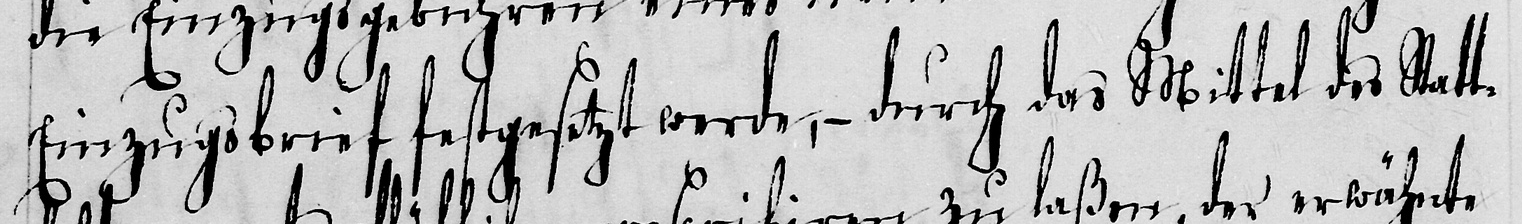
Einzugsbrief festgesetzt werde, – durch das Mittel des Stat¬
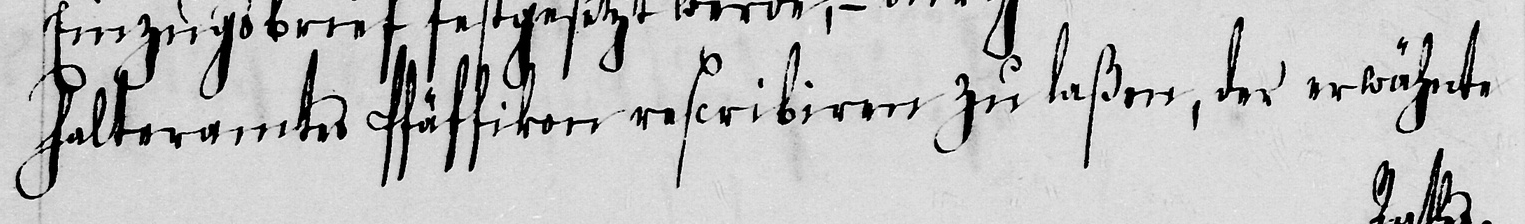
thalteramtes Pfäffikon rescribiren zu laßen, der erwähnte
